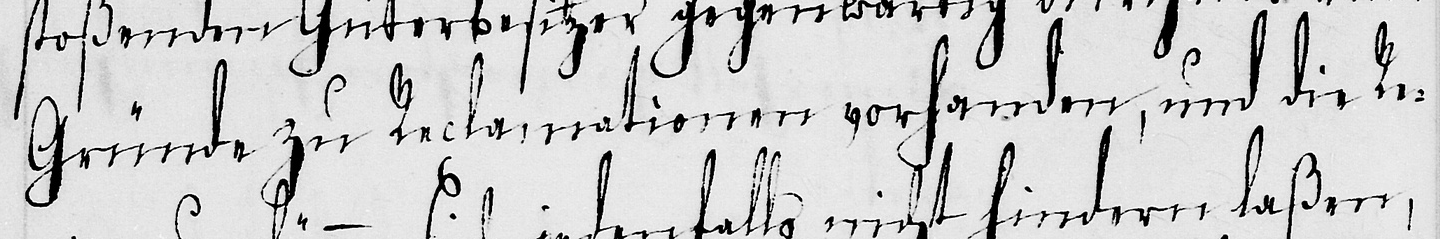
Gründe zu Reclamationen vorhanden, und die Re¬
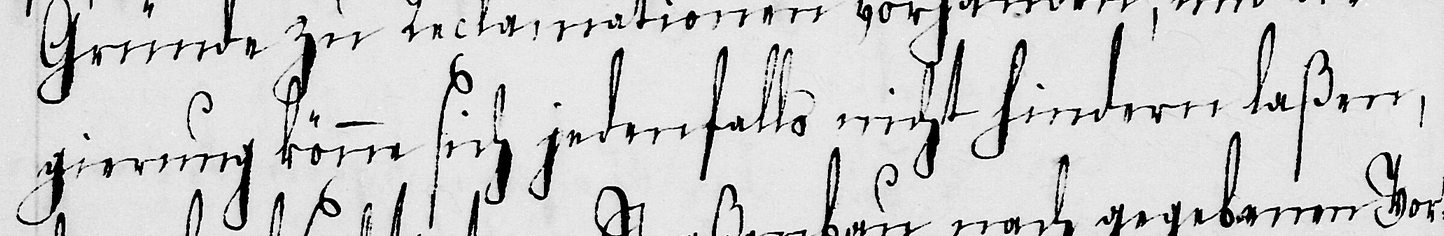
gierung könne sich jedenfalls nicht hindern laßen,
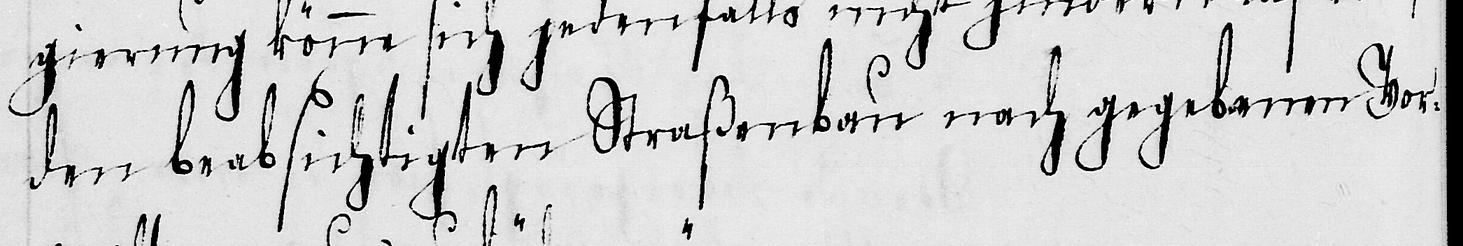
den beabsichtigten Straßenbau nach gegebenen Vor¬
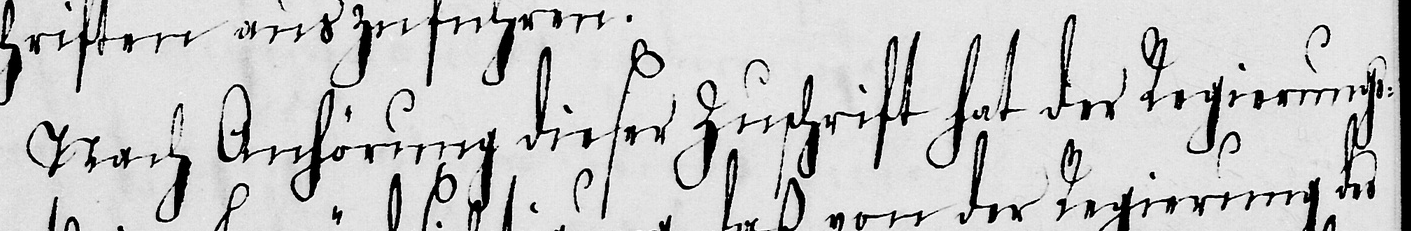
Nach Anhörung dieser Zuschrift hat der Regierung¬
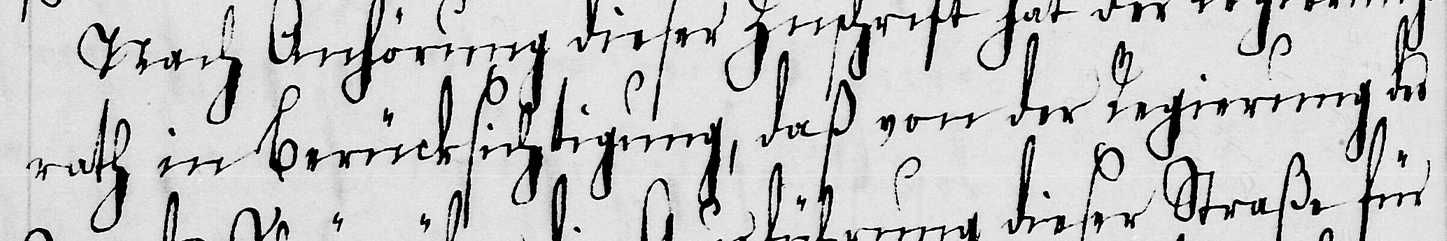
srath in Berücksichtigung, daß von der Regierung des
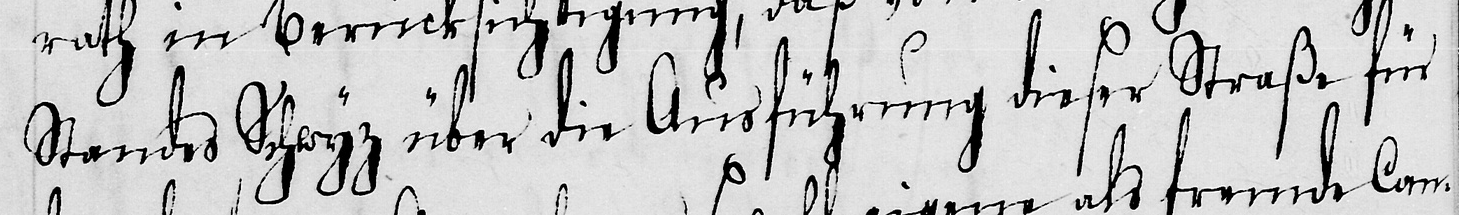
Standes Schwyz über die Ausführung dieser Straße für
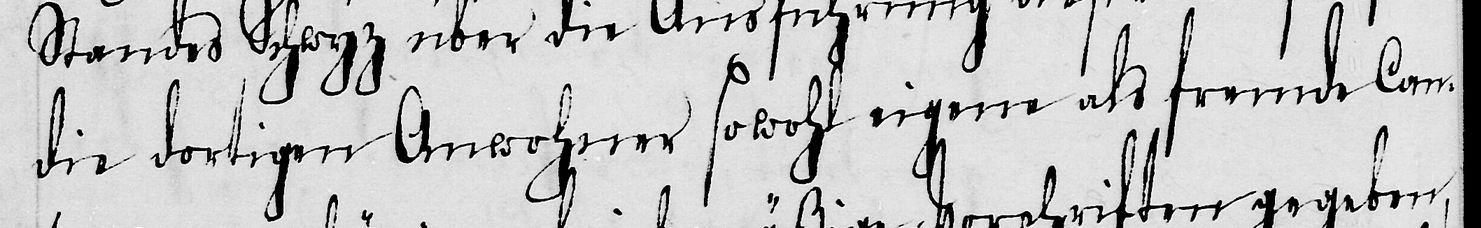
die dortigen Anwohner sowohl eigene als fremde Can¬
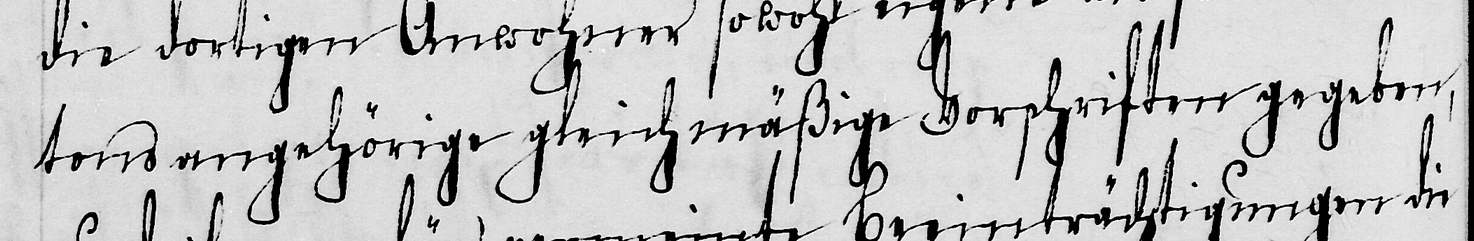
tonsangehörige gleichmäßige Vorschriften gegeben,
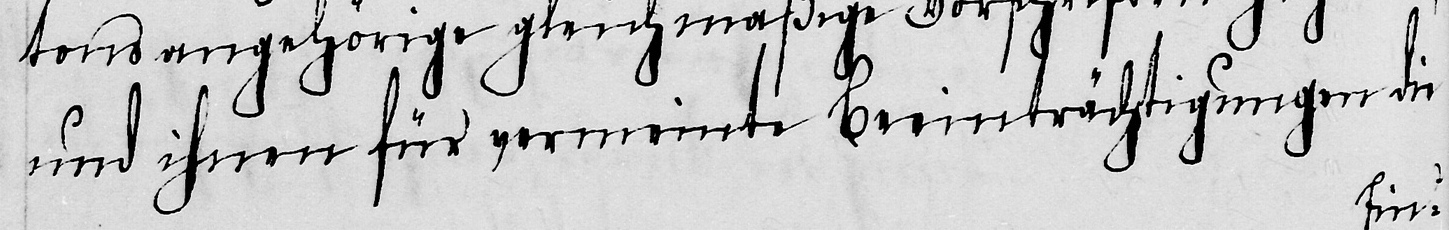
und ihnen für vermeinte Beeinträchtigungen die
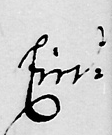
fen¬
